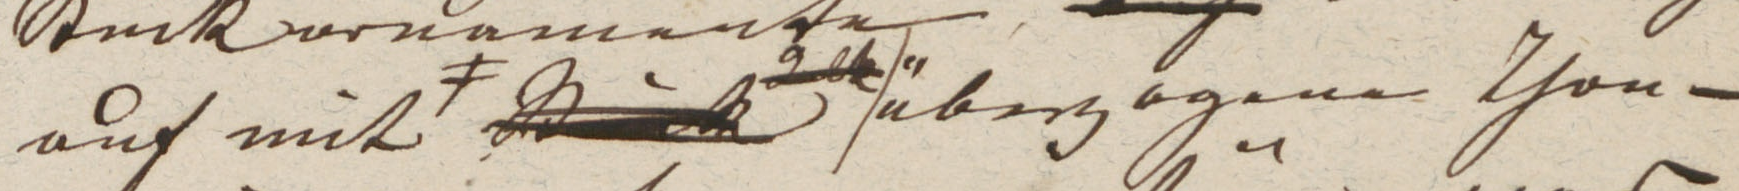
auf mit Stuck % Kalk überzogene Thon-
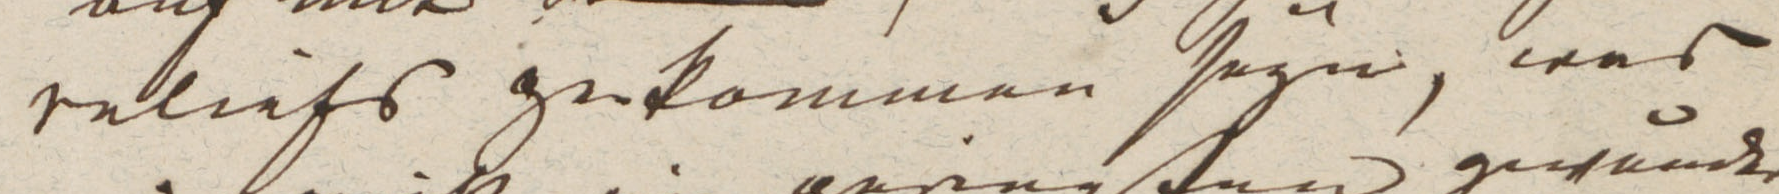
reliefs gekommen seyn, was
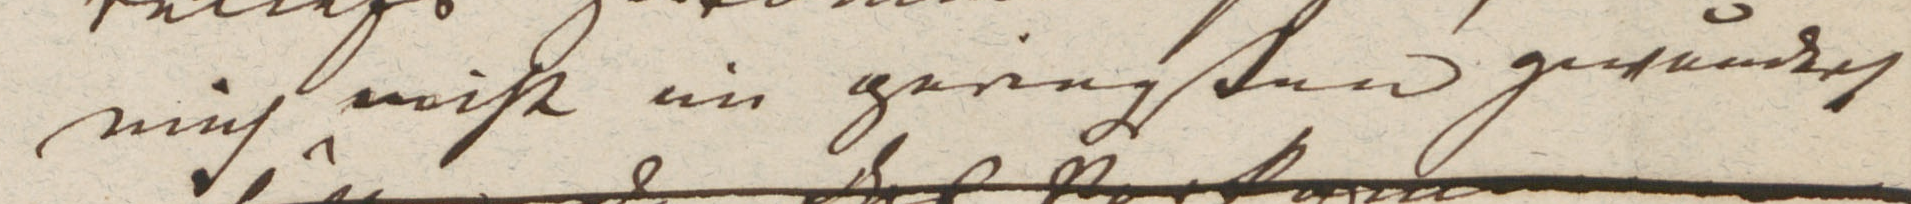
mich nicht im geringsten gewundert
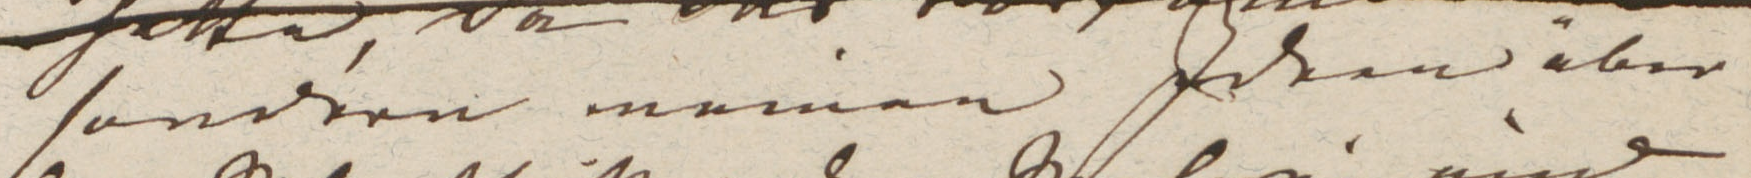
sondern meinen Ideen über
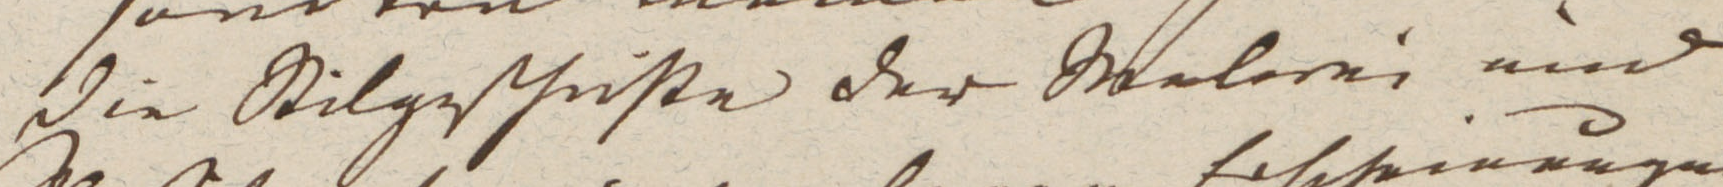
die Stilgeschichte der Malerei und
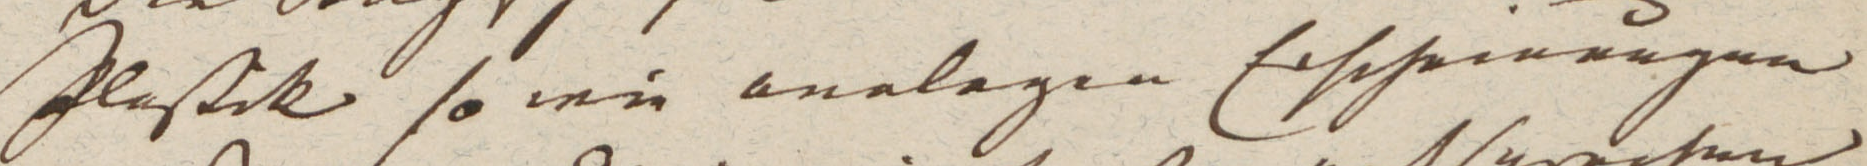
Plastik so wie analogen Erscheinungen
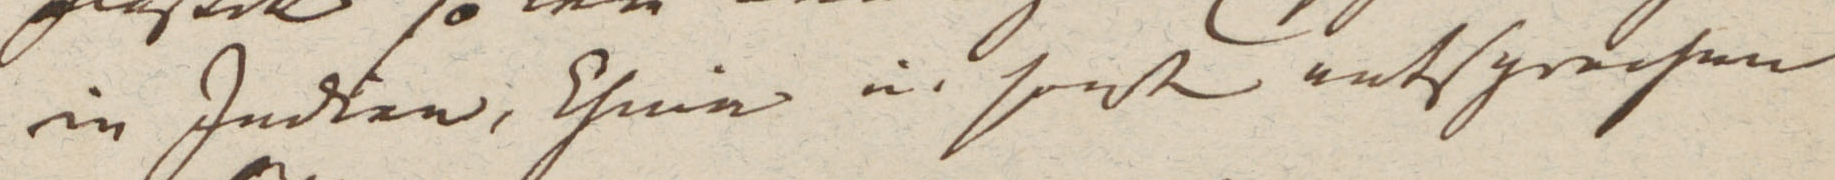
in Indien, China u. sonst entsprochen
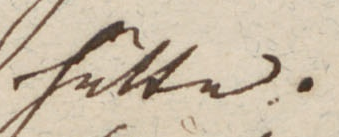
hätte.
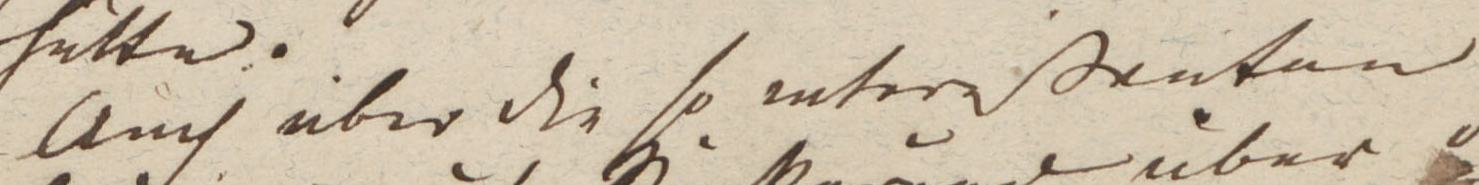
Auch über die so interessanten
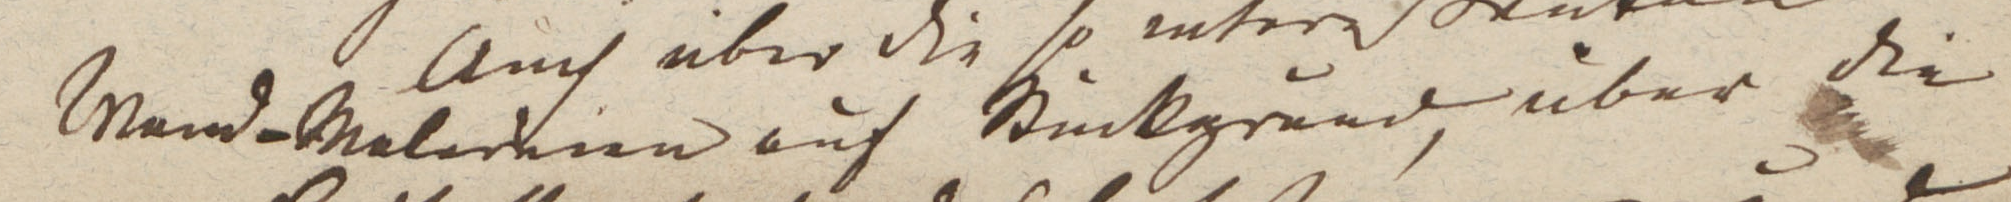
Wand-Malereien auf Stuckgrund, über die
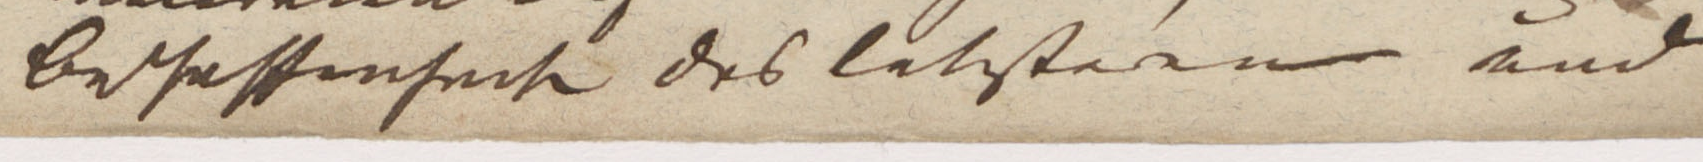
Beschaffenheit des letzteren und
